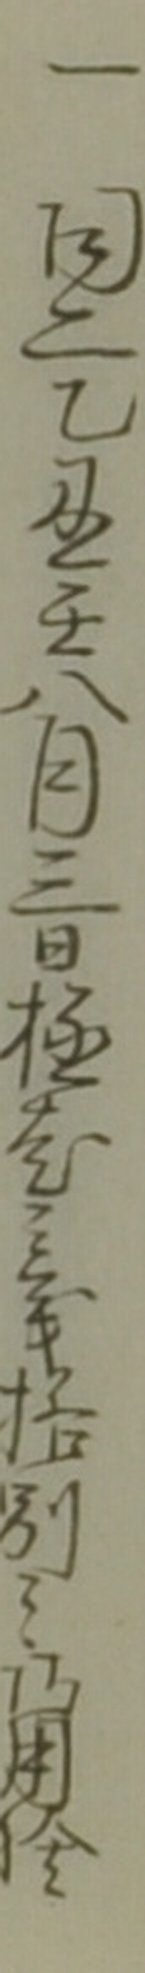一同二乙丑閏八月三日極老之茂格別之御用捨
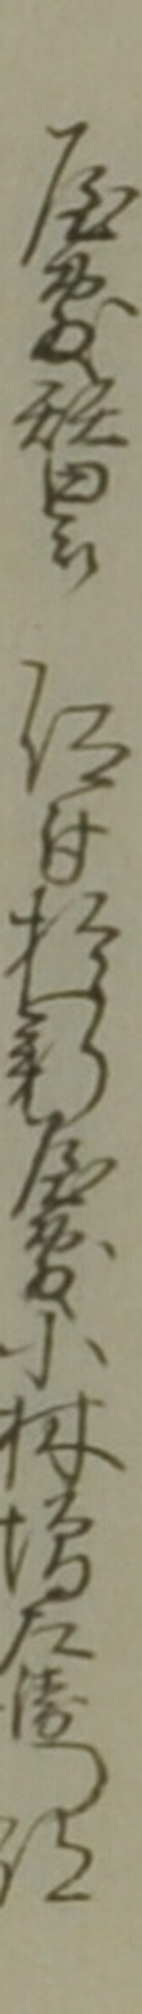屋敷替被仰付於新屋敷小林増左衛門跡
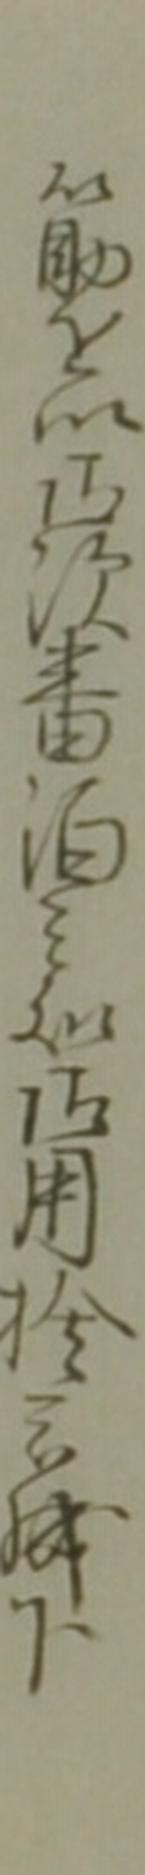筋を以御次番泊之処御用捨被成下
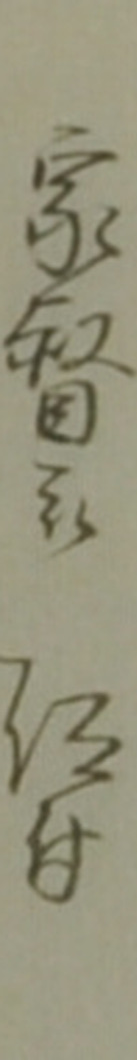家督被仰付

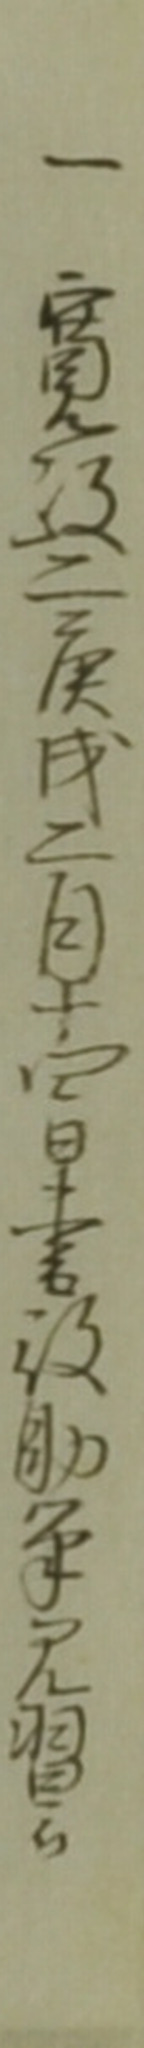一寛政二庚戌二月十四日書役助筆見習被
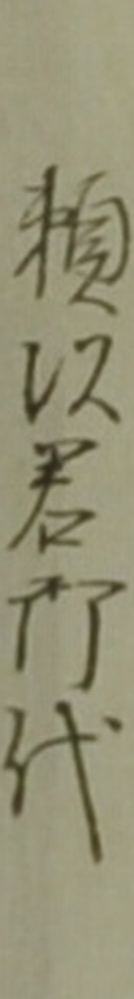頼以君御代
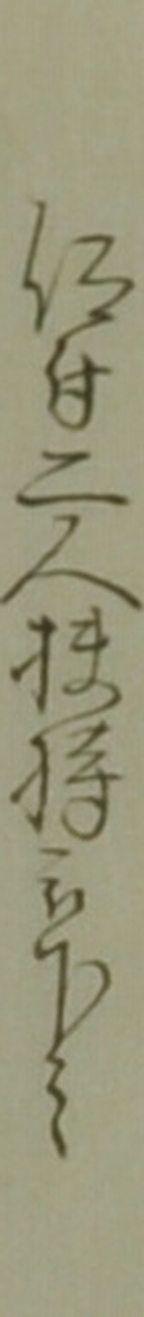仰付二人扶持被下之
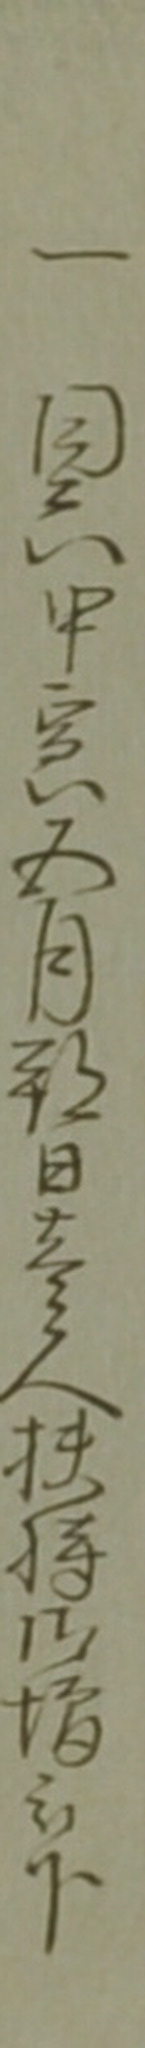一同六甲寅五月朔日壱人扶持御増被下
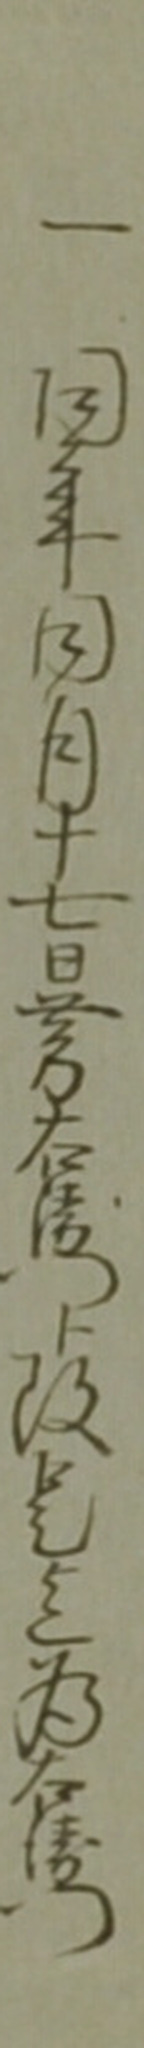一同年同月十七日芳右衛門ト改是迄為右衛門
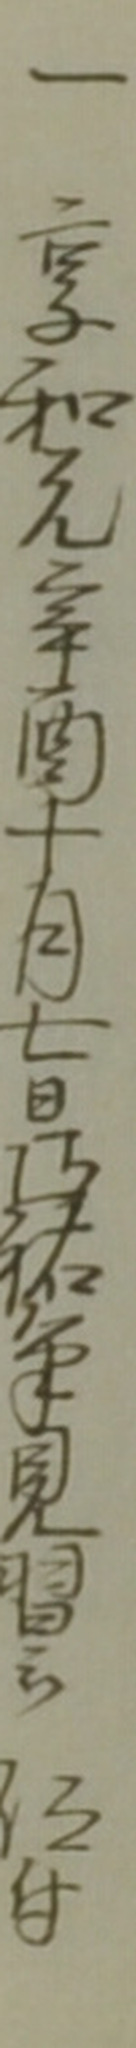一享和元辛酉十月七日御祐筆見習被仰付
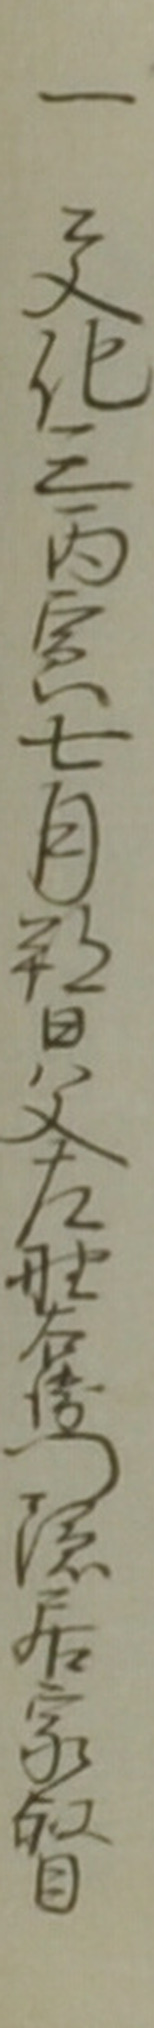一文化三丙寅七月朔日父左野右衛門隠居家督
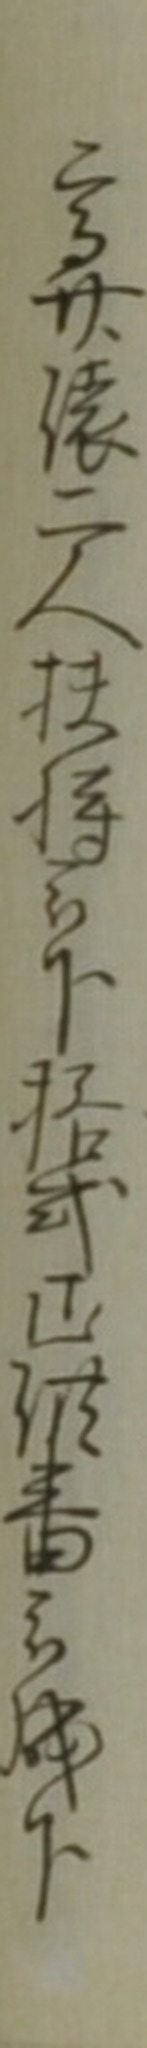高廿俵二人扶持被下格式御供番被成下
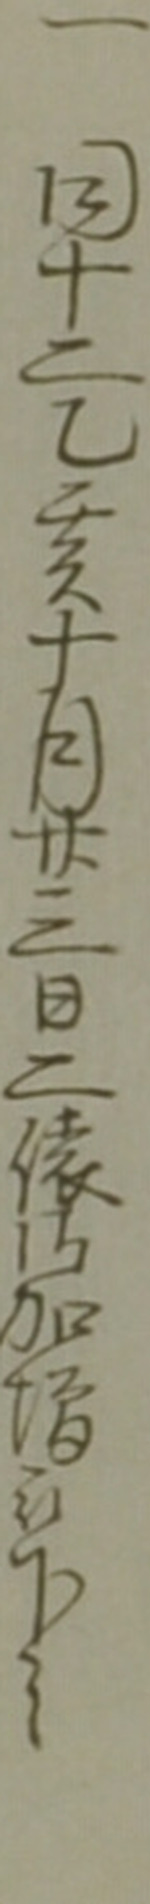一同十二乙亥十月廿三日二俵御加増被下之
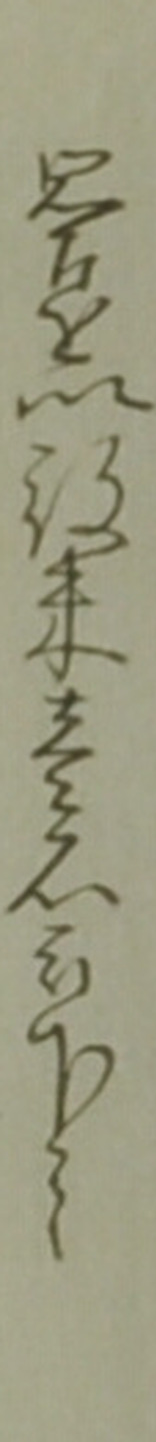思召を以役米壱石被下之

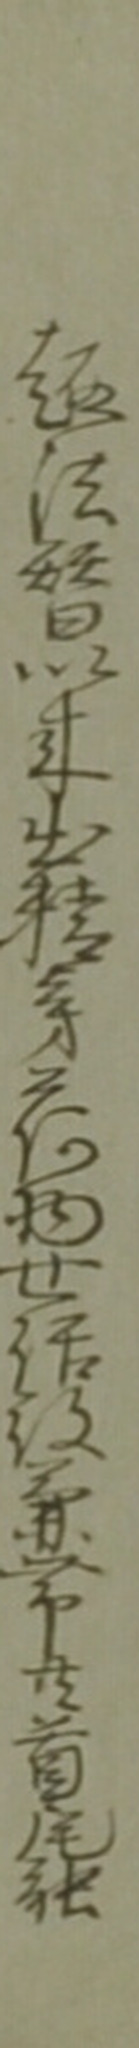趣法替以来出精旁荷物世話役兼帯共首尾能
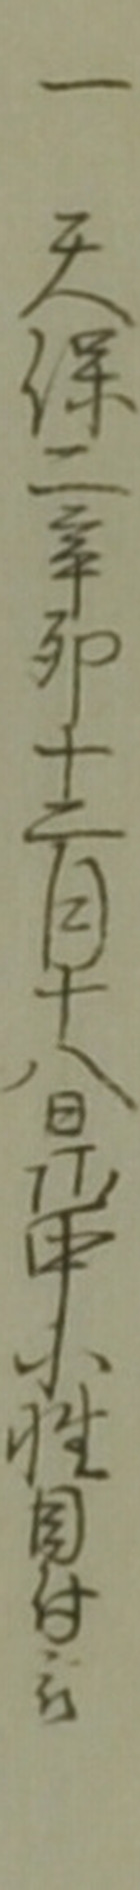一天保二辛卯十二月十八日御中小性目付被
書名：無足諸士勤仕録（二）
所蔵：伊那市立高遠町図書館・合同会社AMANE
